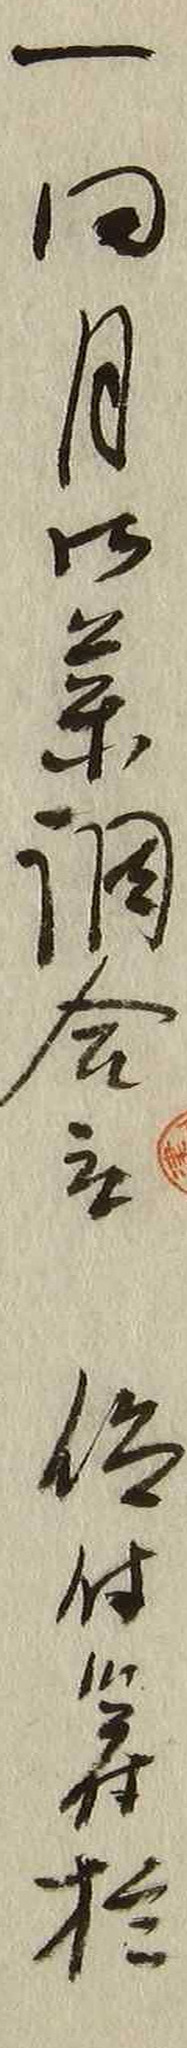一同月御薬調合被仰付候ニ付於
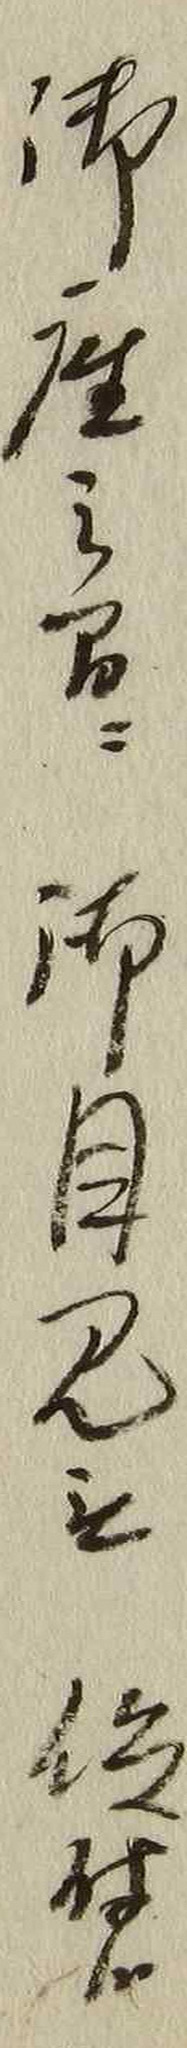御座之間ニ御目見被仰付候
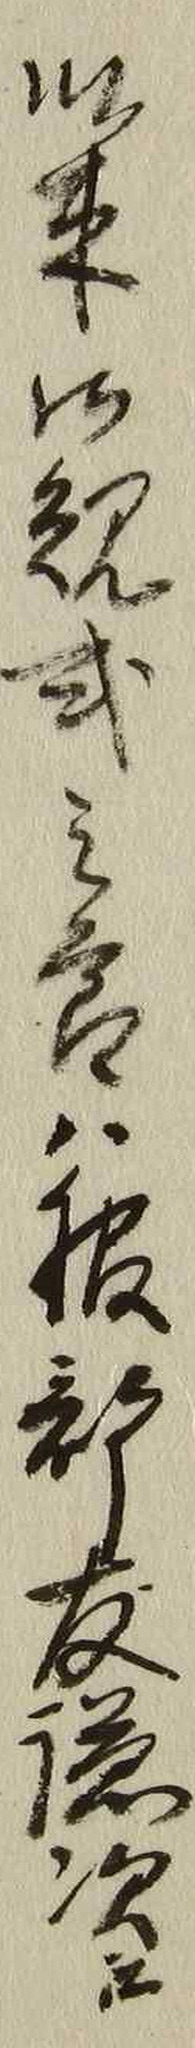以来御規式之節ハ服部友謙次江
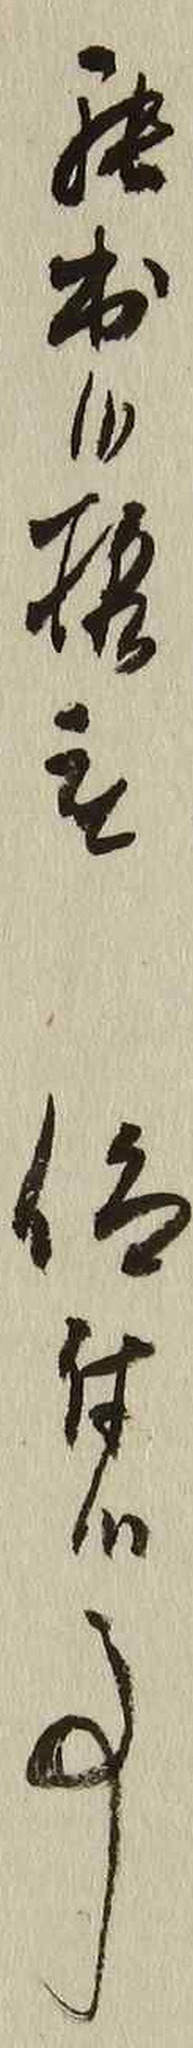罷出候様被仰付候事
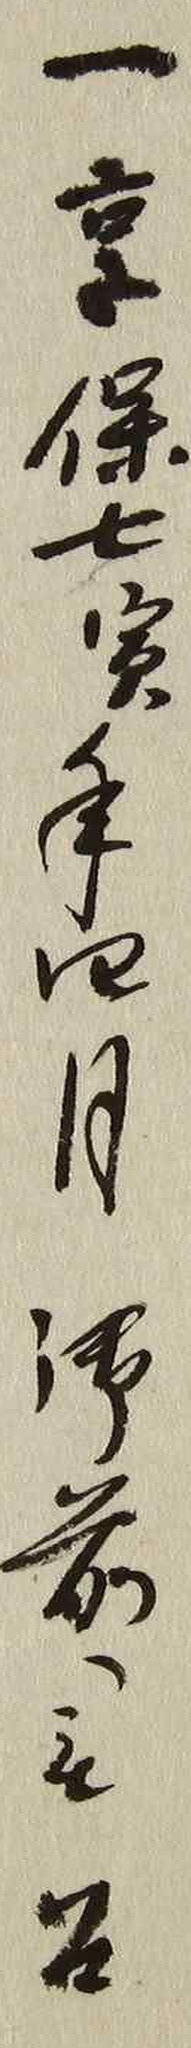一享保七寅年四月御前へ被召
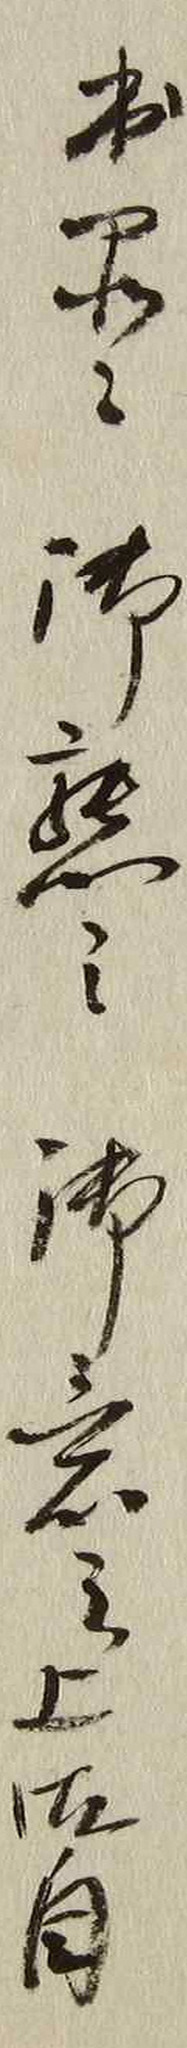出品々御懇之御意之上御自
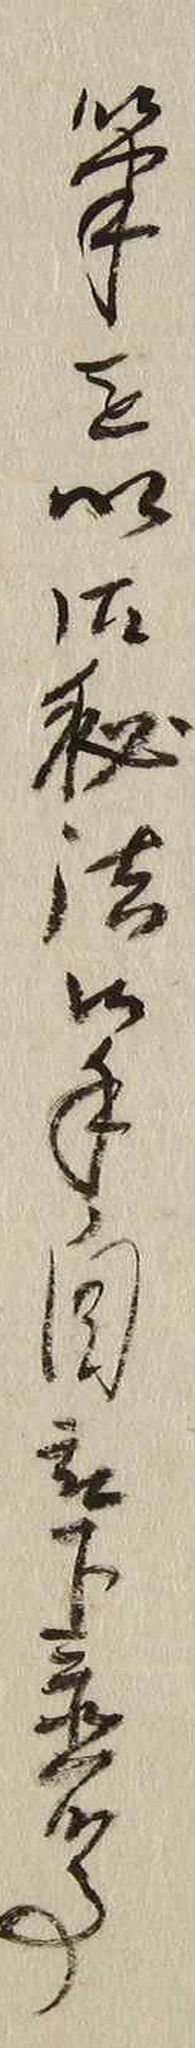筆を以御秘詰御手自被下置候事
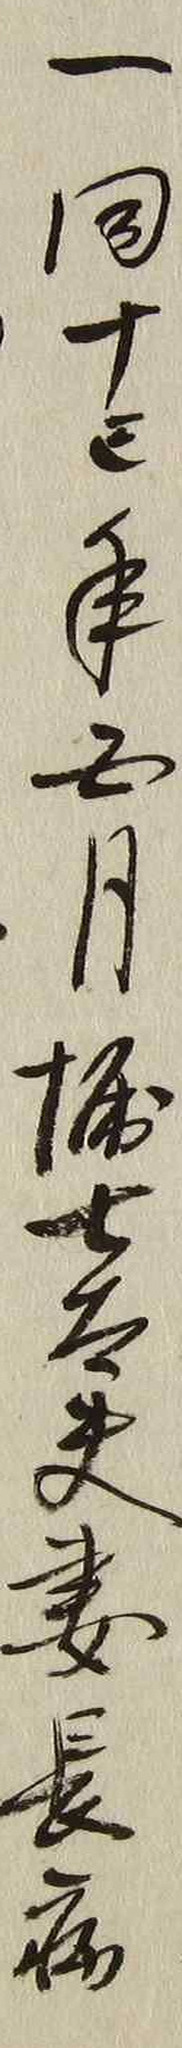一同十巳年五月堀七太夫妻長病
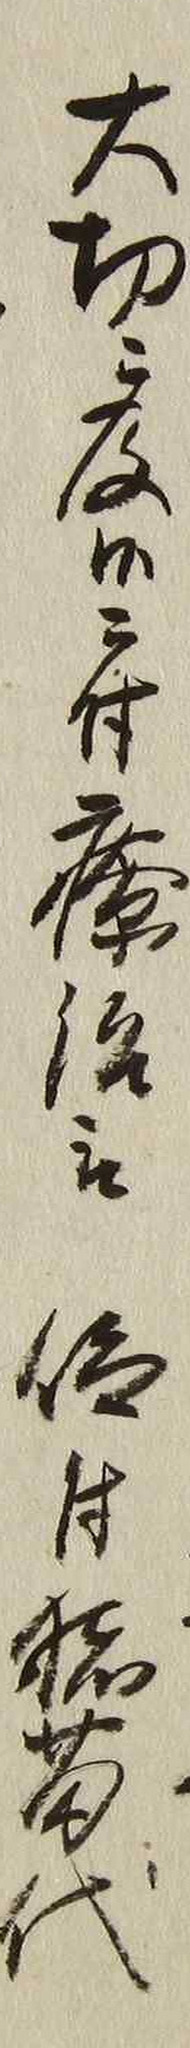大切ニ及候ニ付療治被仰付猪苗代
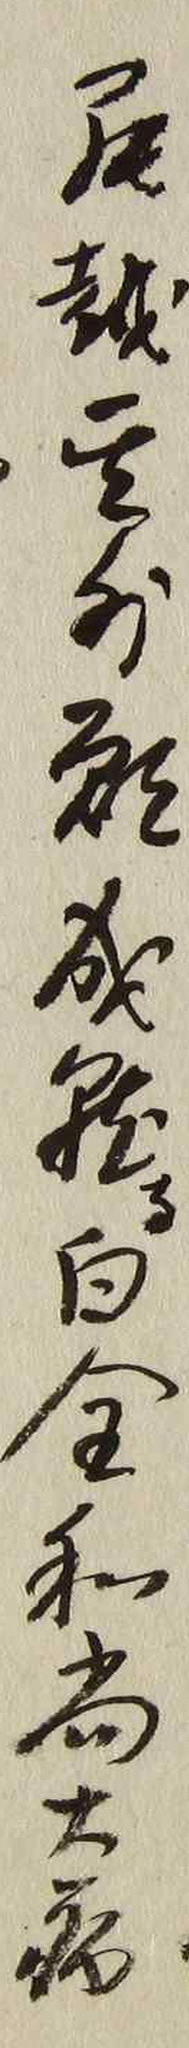罷越其外願成就寺白全和尚大病
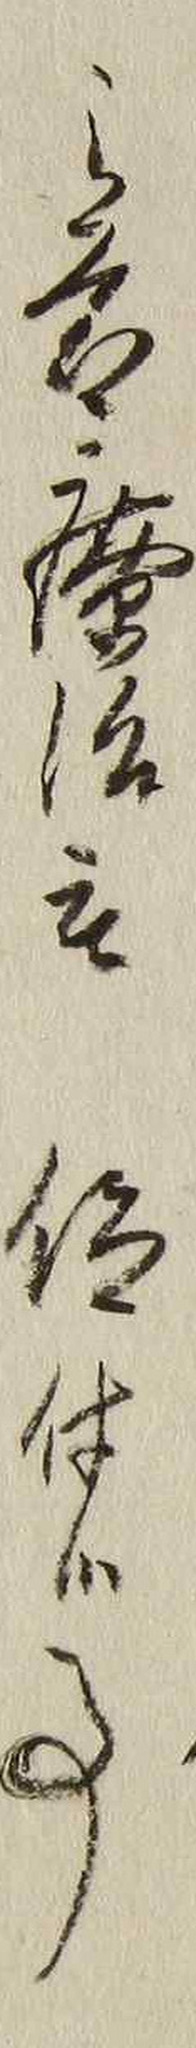之節療治被仰付候事
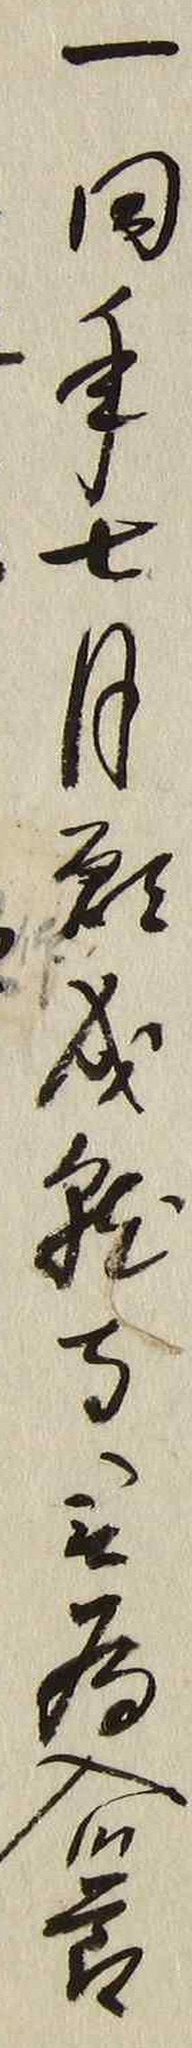一同年七月願成就寺へ被為入候節
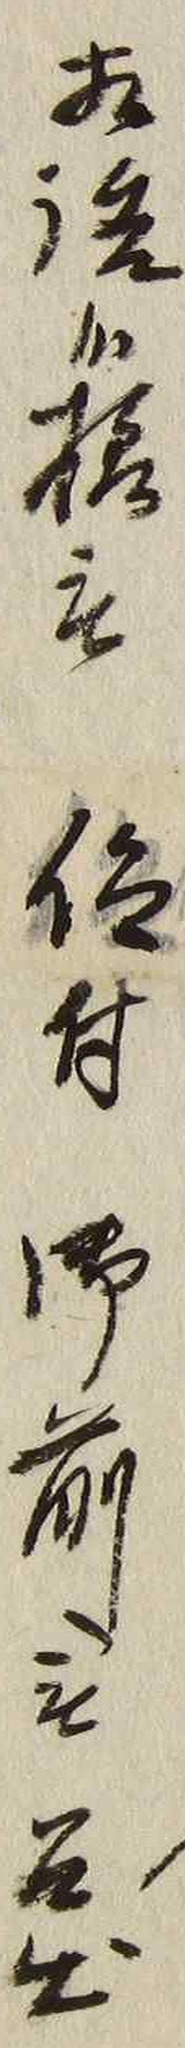相詰候様被仰付御前へ被召出
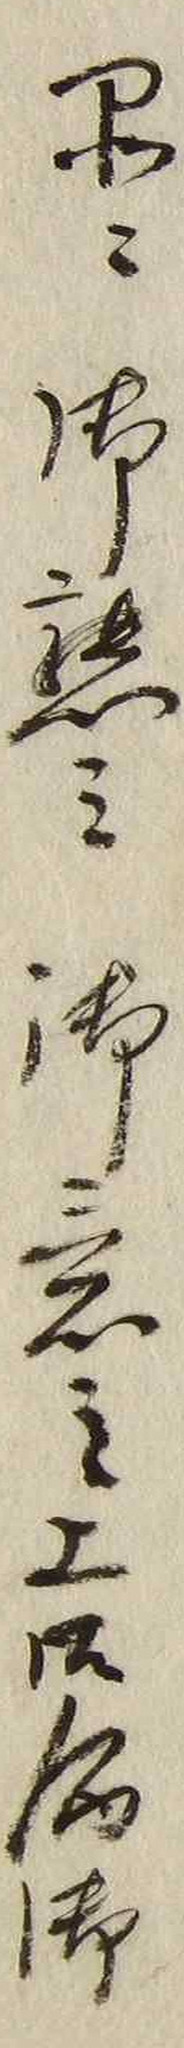品々御懇之御意之上御酒御

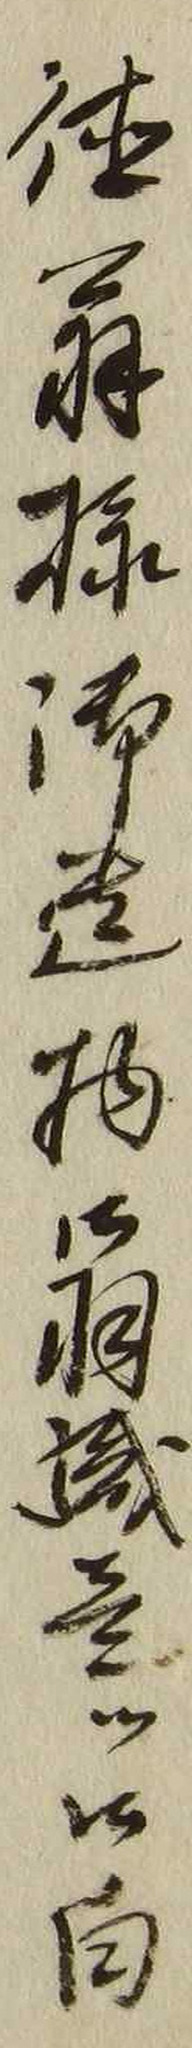徳翁様御遺物御羽織壱ツ御白
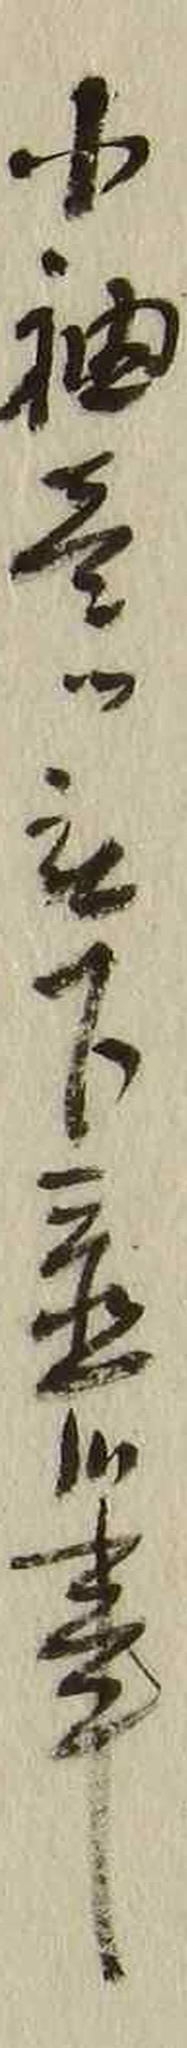小袖壱ツ被下置候事
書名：諸士系譜　巻之353　す之部3
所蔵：会津若松市立会津図書館
